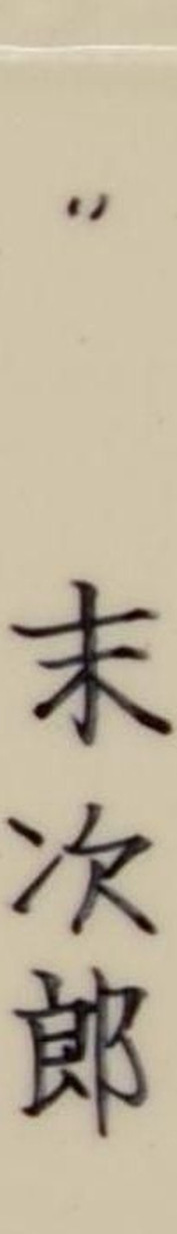末次郎
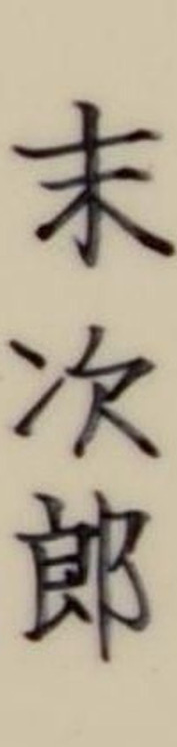末次郎
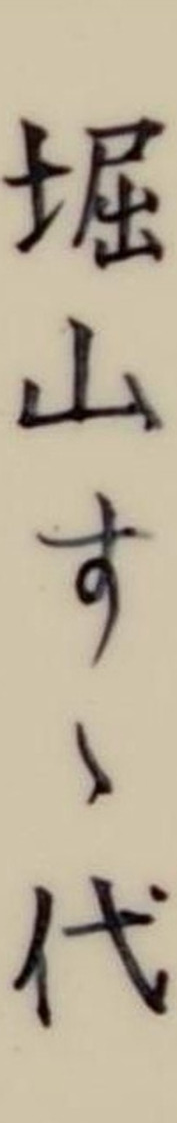堀山すず代
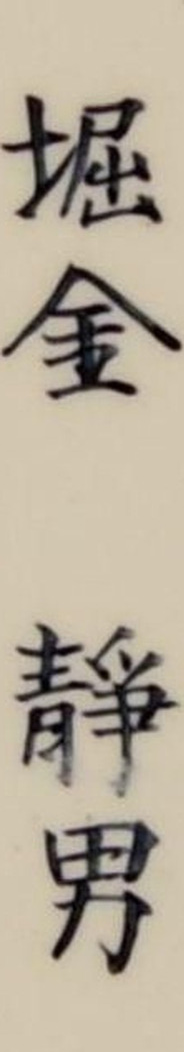堀金静男
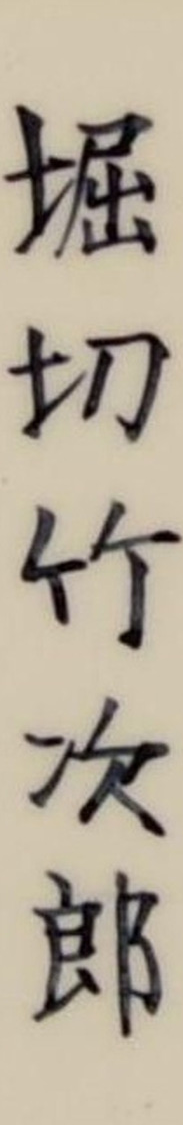堀切竹次郎
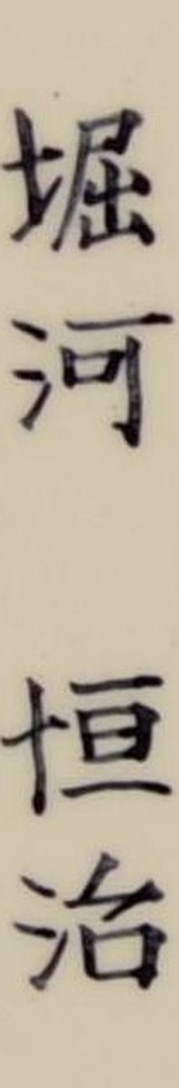堀河恒治
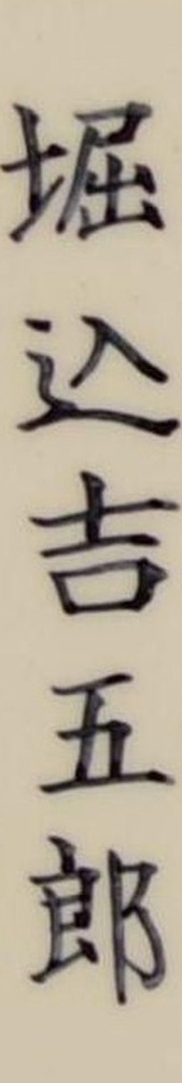堀込吉五郎
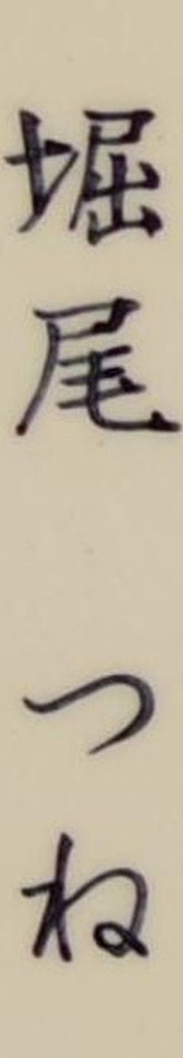堀尾つね
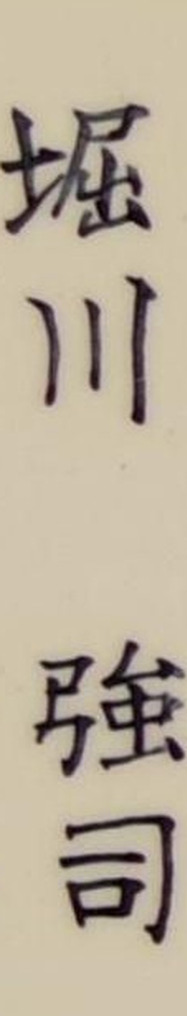堀川強司
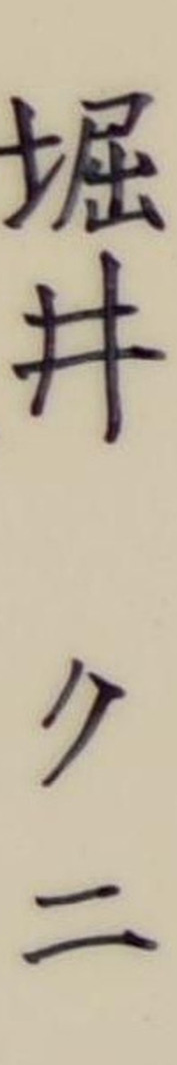堀井ク二
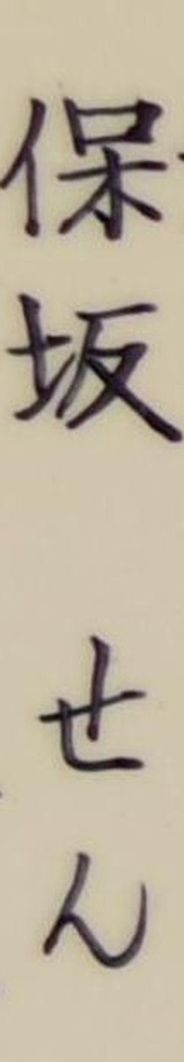保坂せん

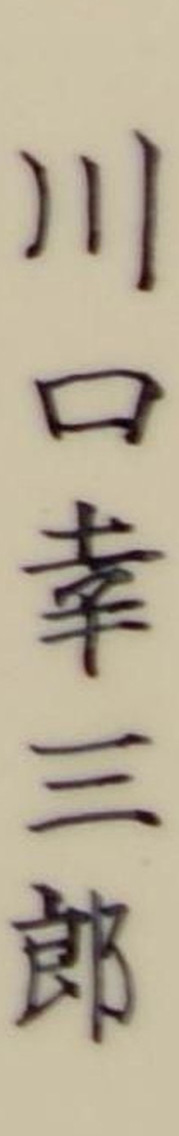川口幸三郎
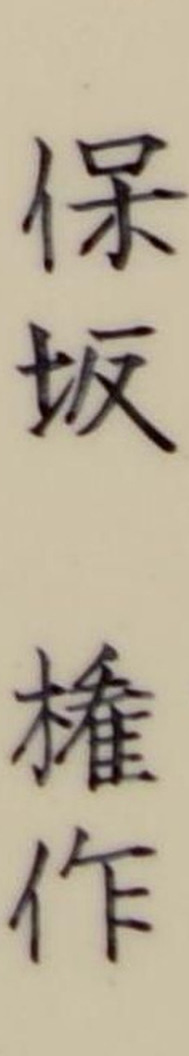保坂権作
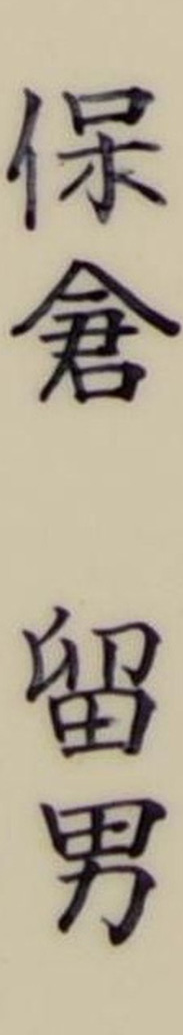保倉留男
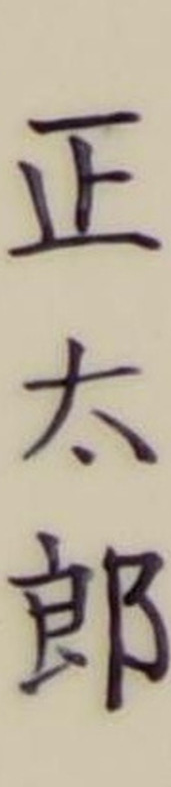正太郎
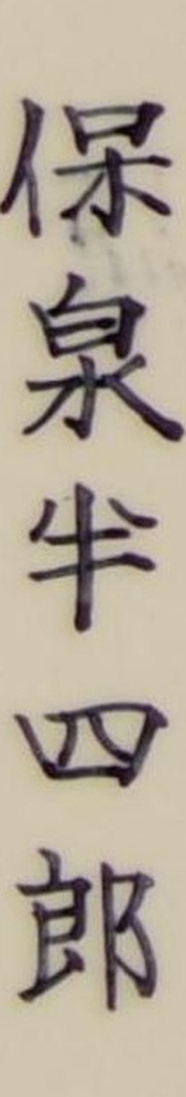保泉半四郎
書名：A~D
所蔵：koyasan kongobuji
